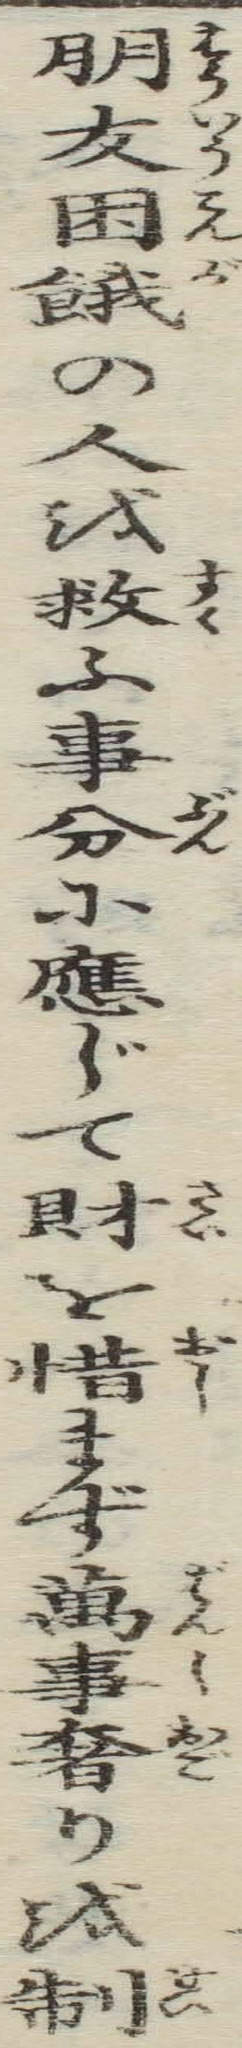朋友困餓の人を救ふ事分に応じて財を惜まず万事奢りを制
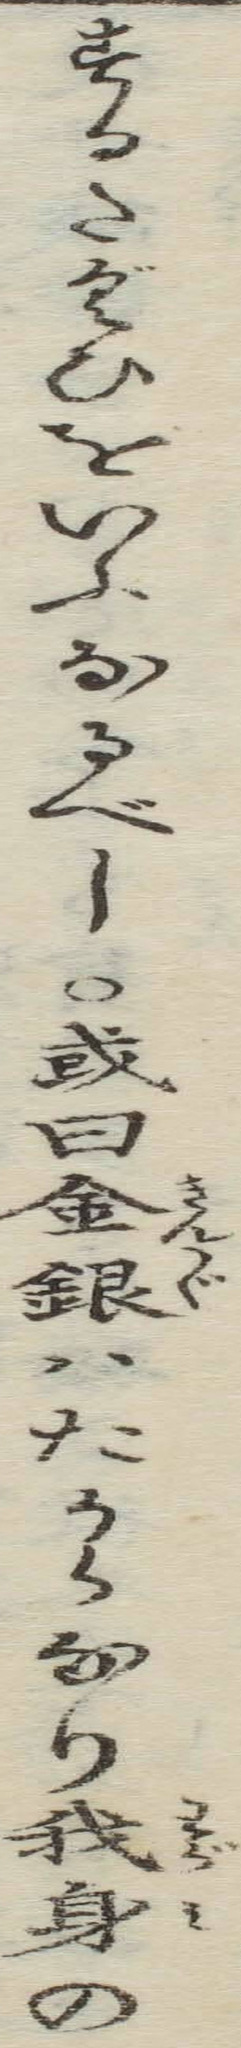するたぐひをいふなるべし○或曰金銀はたからなり我身の
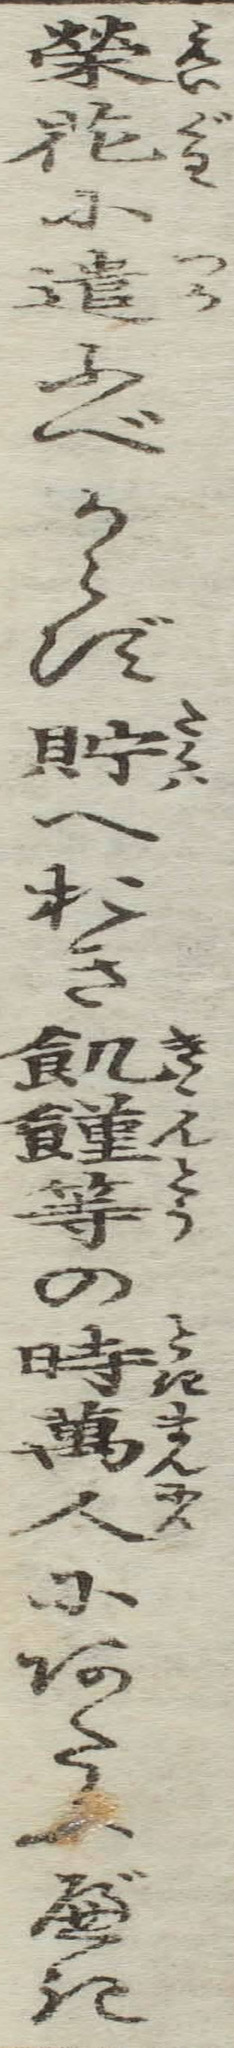栄花に遣ふべからず貯へおき飢饉等の時万人にあたふべき
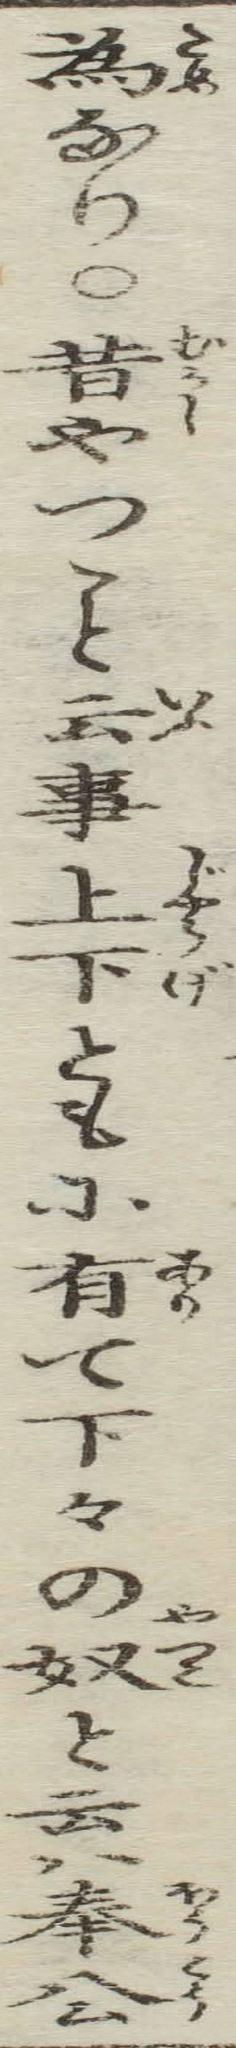為なり○昔やつこと云事上下ともに有て下々の奴と云は奉公
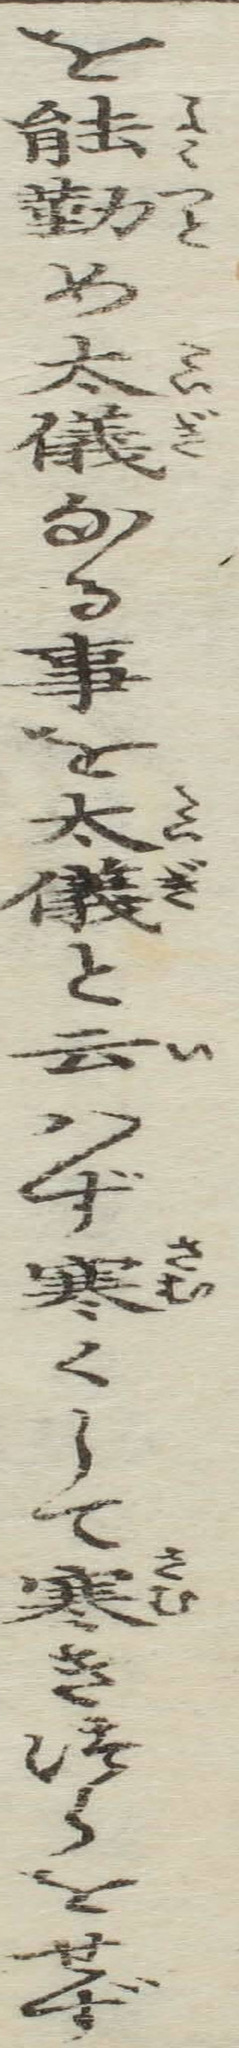を能勤め太儀なる事を太儀と云はず寒くして寒きつらをせず
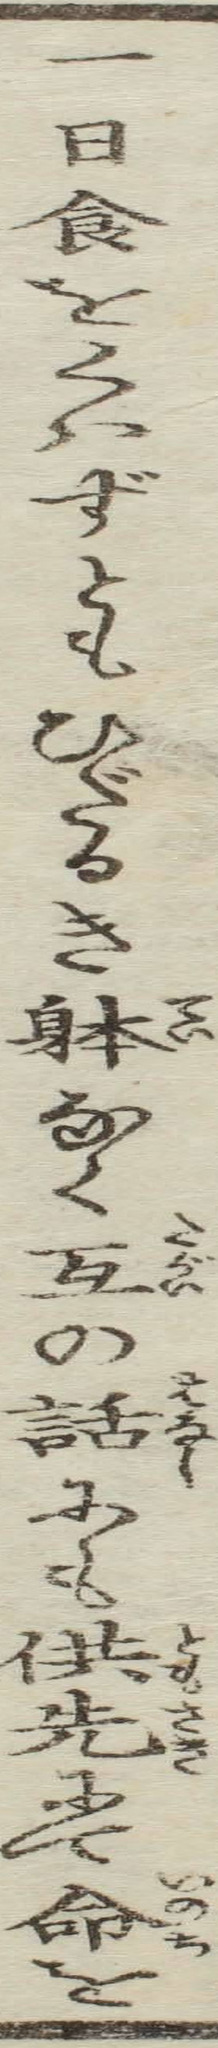一日食をくはずともひだるき躰なく互の話にも供先にて命を
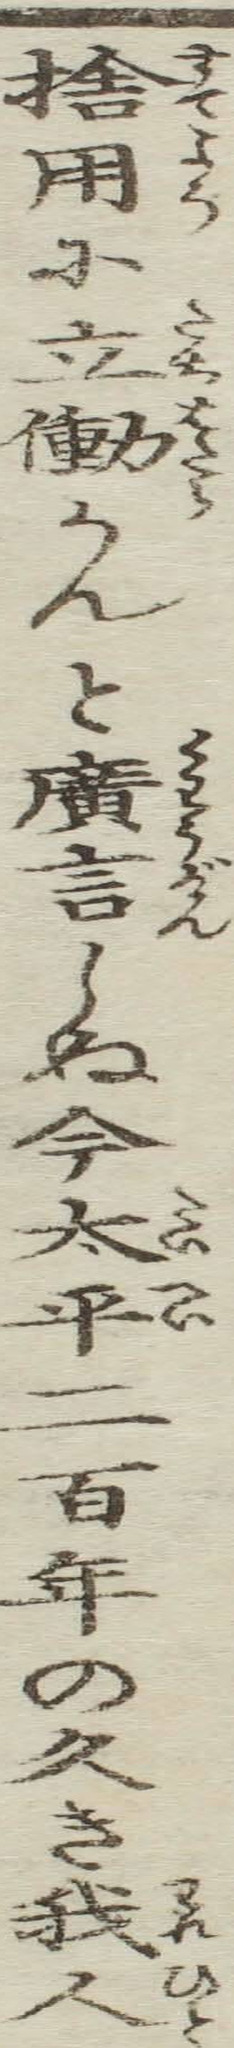捨用に立働かんと広言しぬ今大平二百年の久き我人
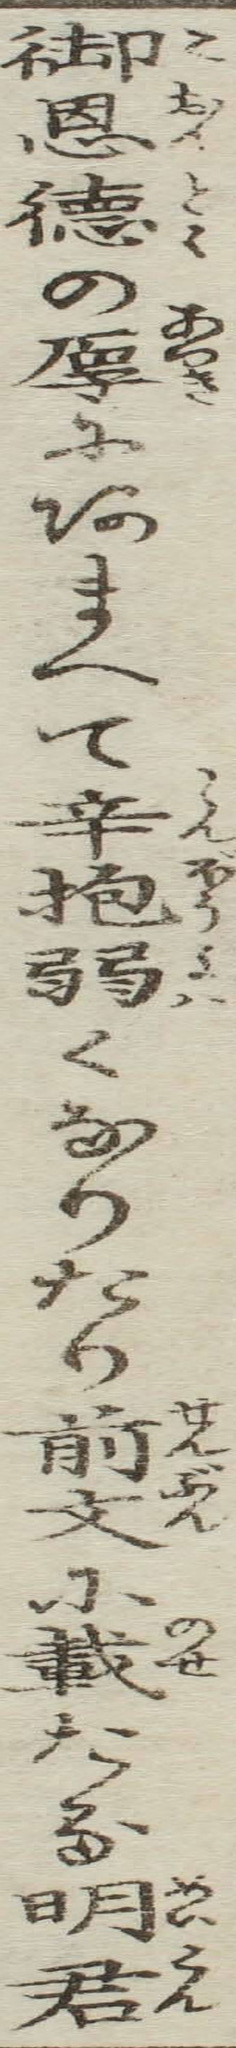御恩徳の厚にあまへて辛抱弱くなりたり前文に載たる明君
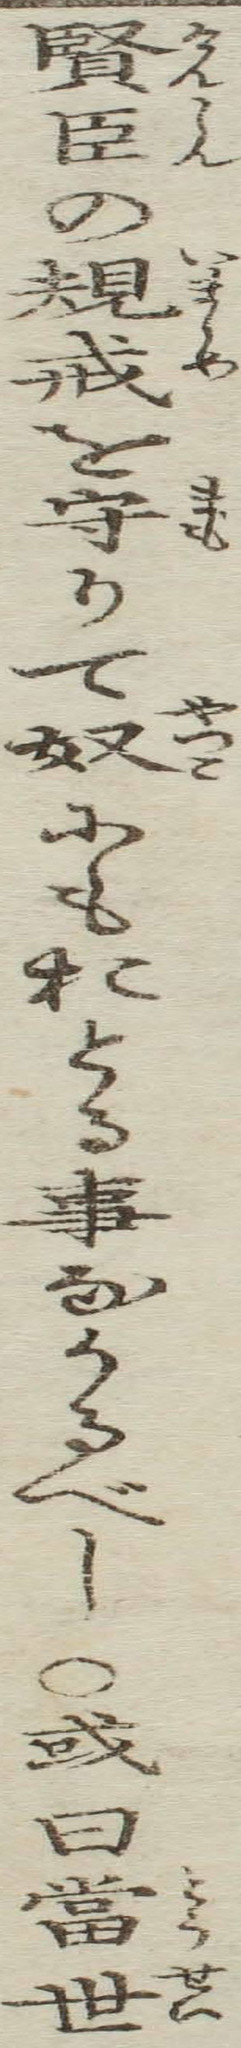賢臣の規戒を守りて奴にもおとる事なかるべし○或曰当世
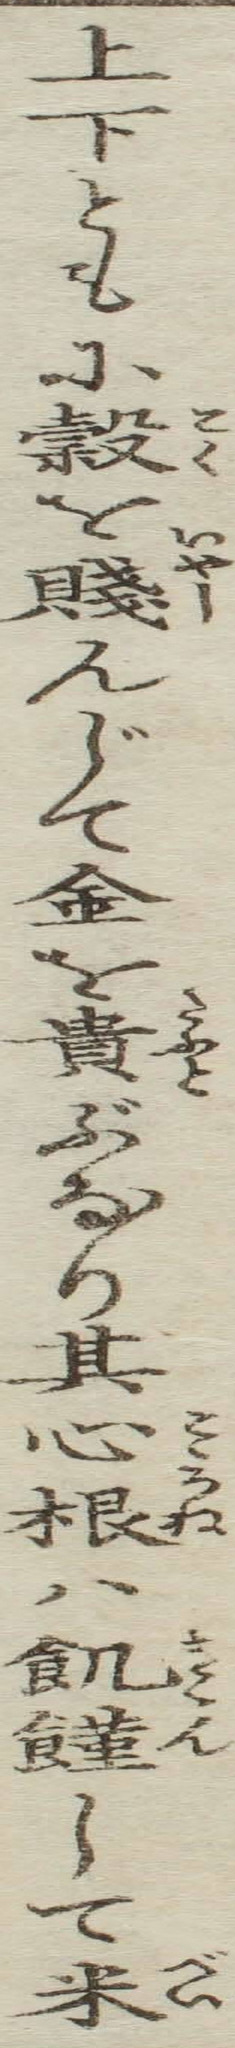上下ともに穀を賤んじて金を貴ぶなり其心根は飢饉して米

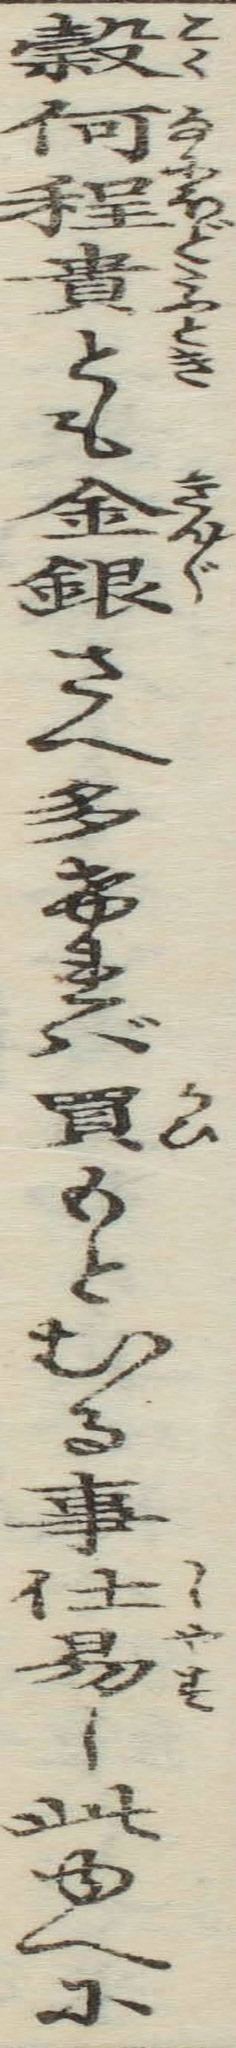穀何程貴とも金銀さへ多ければ買もとむる事仕易し此ゆへに
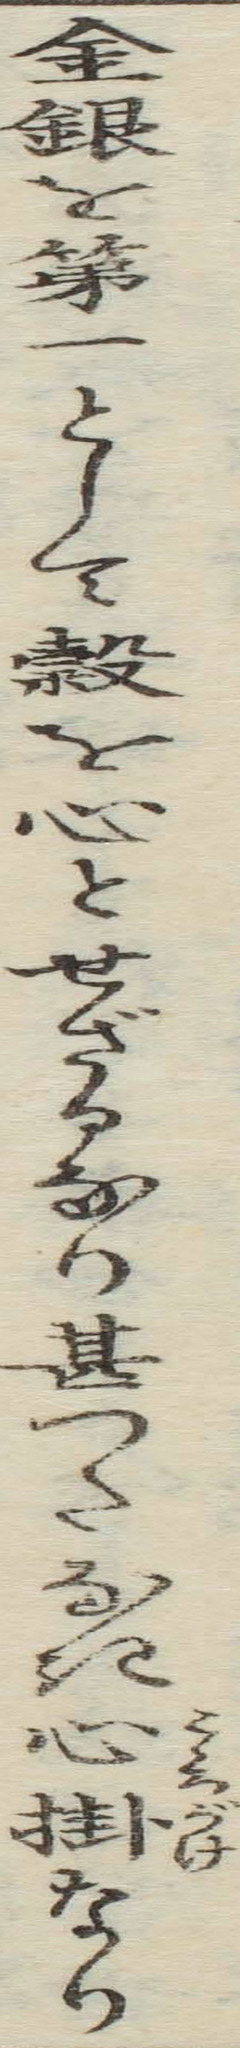金銀を第一として穀を心とせざるなり甚つたなき心掛なり
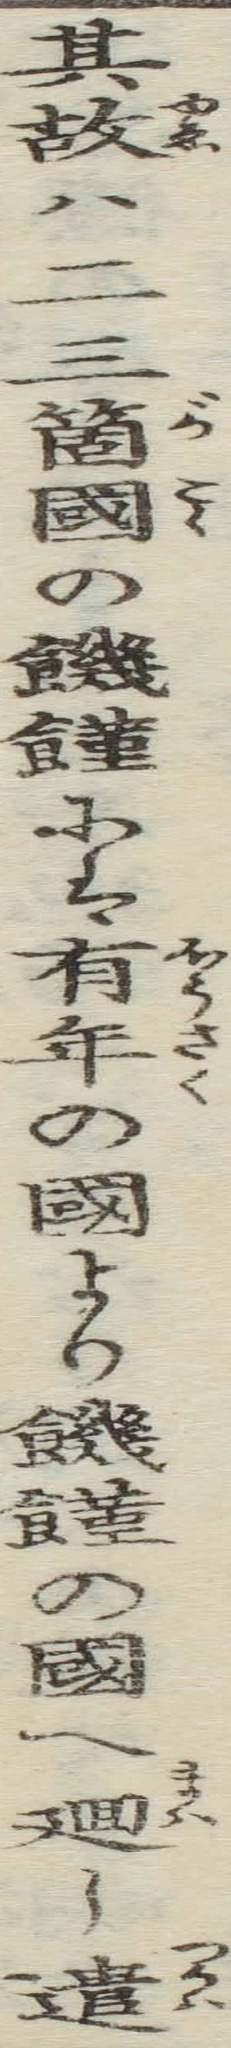其故は二三箇国の饑饉には有年の国より饑饉の国へ廻し遣
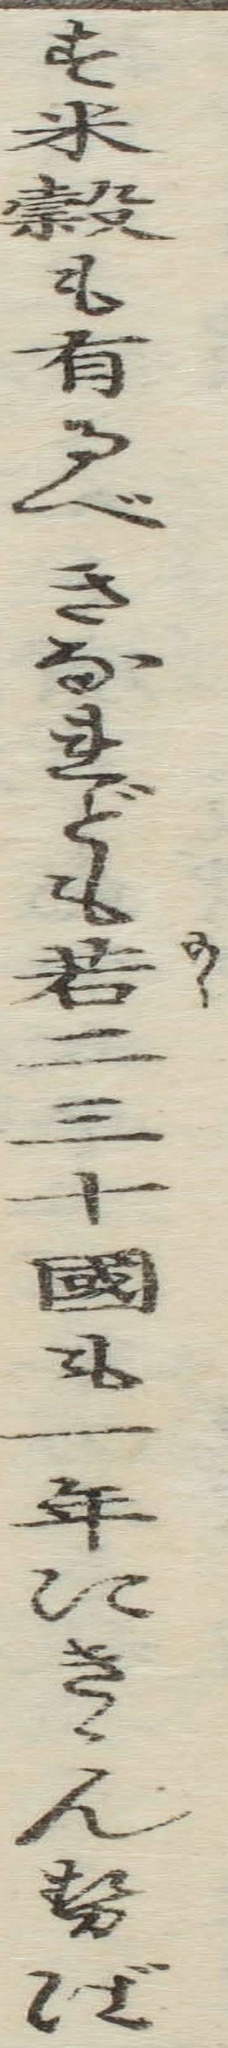す米穀も有るべきなれども若二三十国も一年にきゝんせば
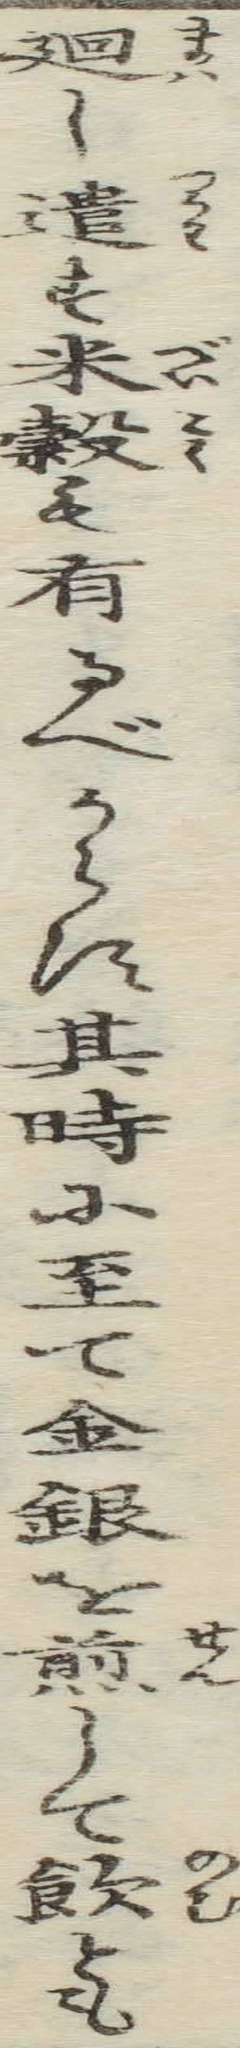廻し遣す米穀も有るべからす其時に至て金銀を煎して飲とも
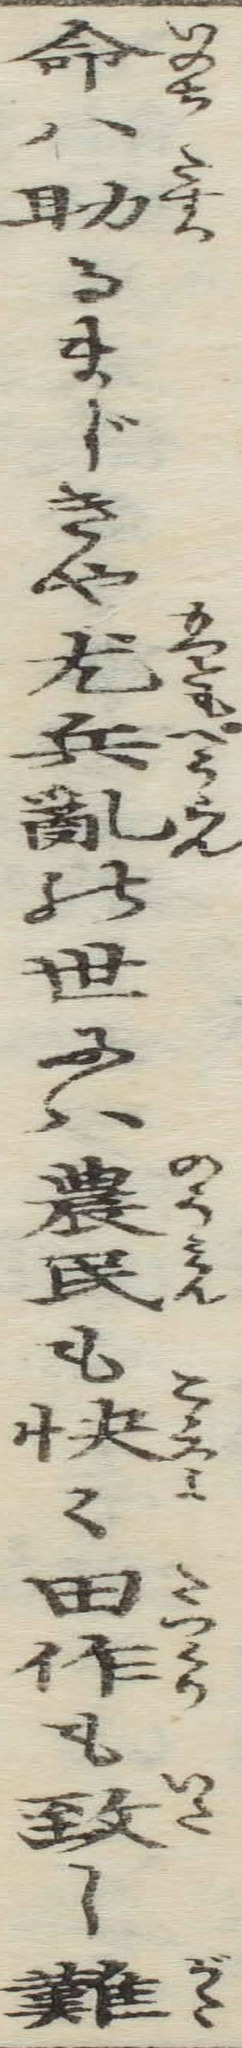命は助るまじきや尤兵乱の世には農民も快く田作も致し難
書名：救荒便覧
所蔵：国文学研究資料館
